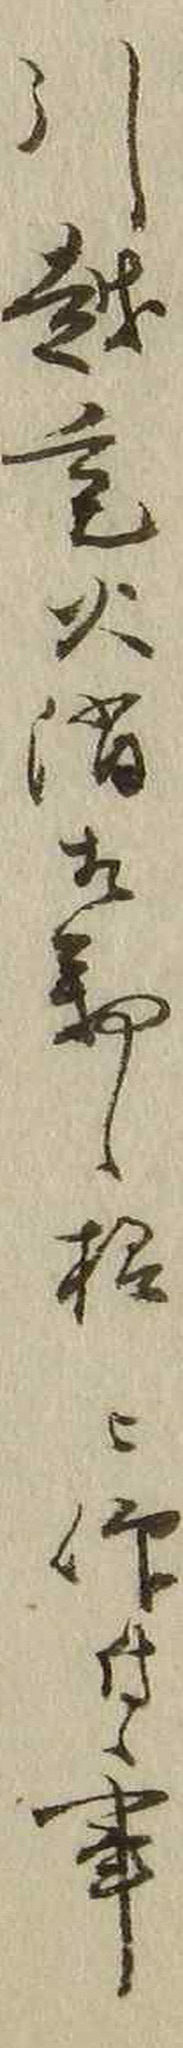引越定火消相勤候様被仰付候事
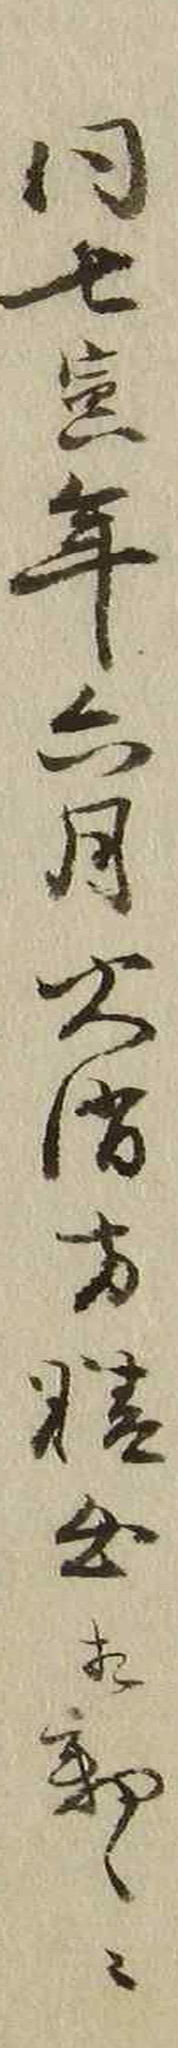一同七寅年六月火消方精出相勤候ニ
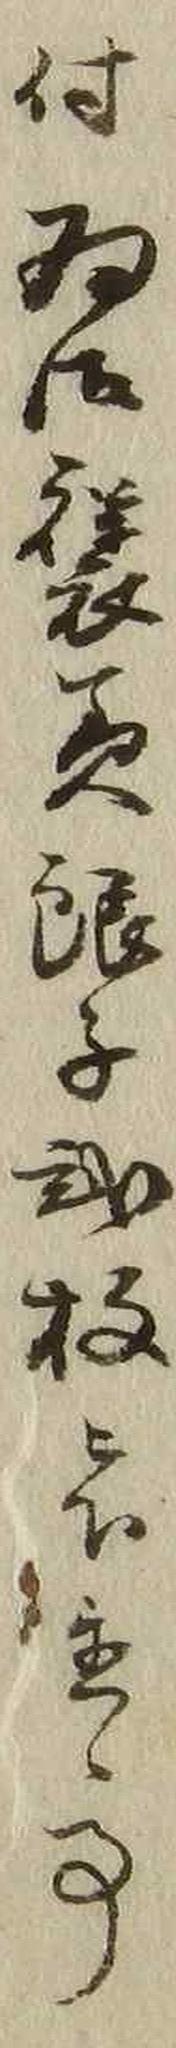付為御褒美銀子弐枚被下置候事
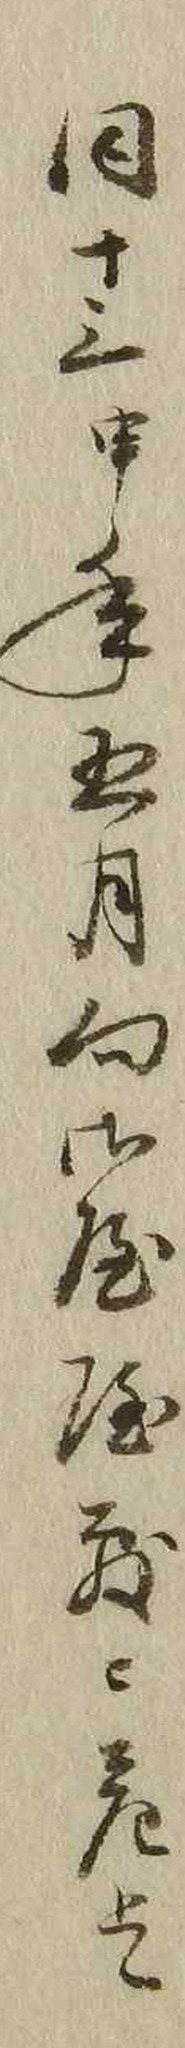一同十三申年五月向御屋屋敷被差上候
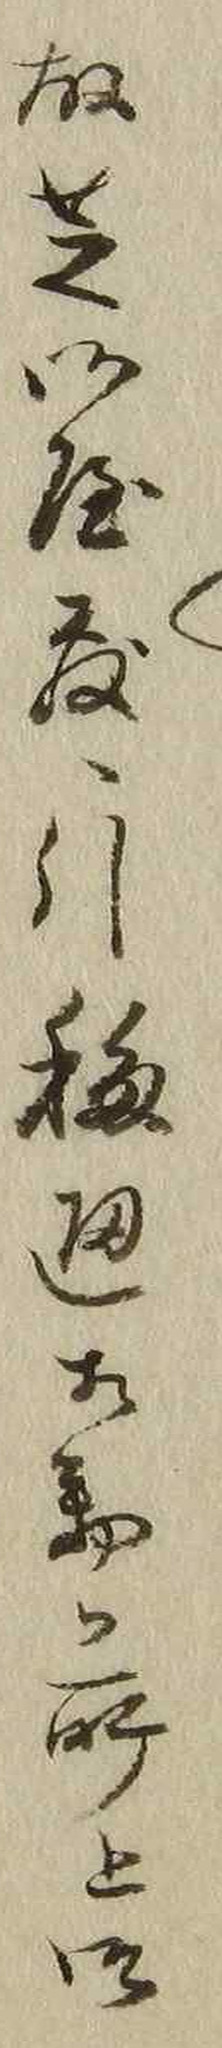故芝御屋敷へ引移通相勤候所上御
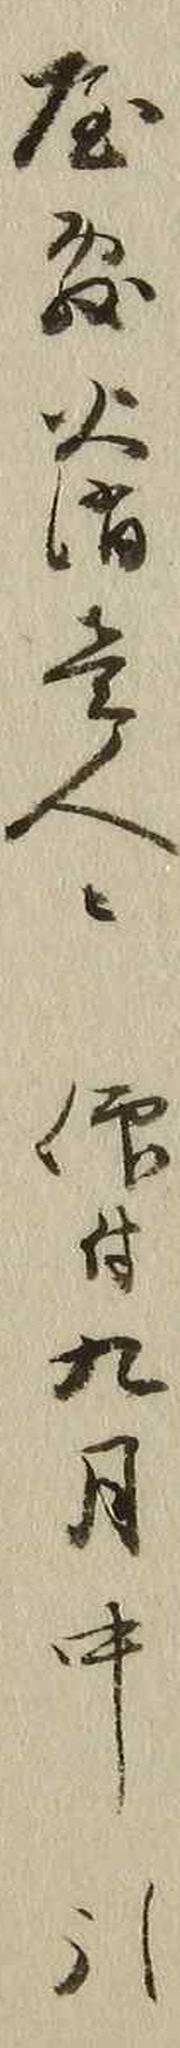屋敷火消壱人被仰付九月中引
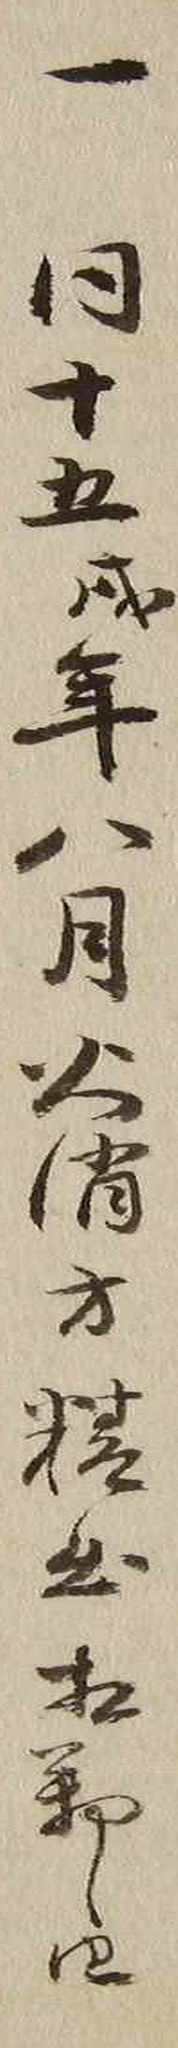一同十五戌年八月火消方精出相勤候由
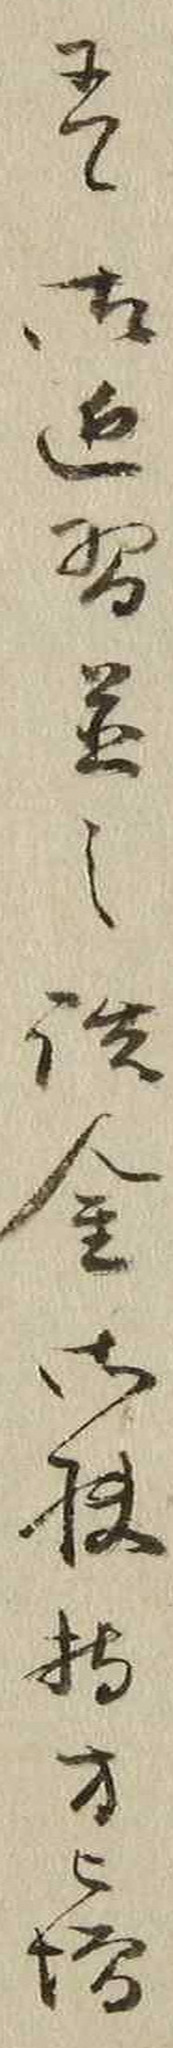にて御近習並之詰金御扶持方被増
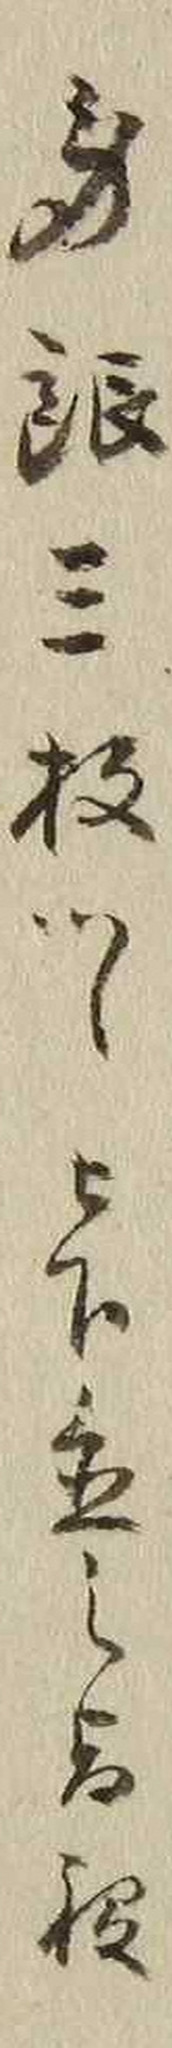労銀三枚ツヽ被下置之旨被
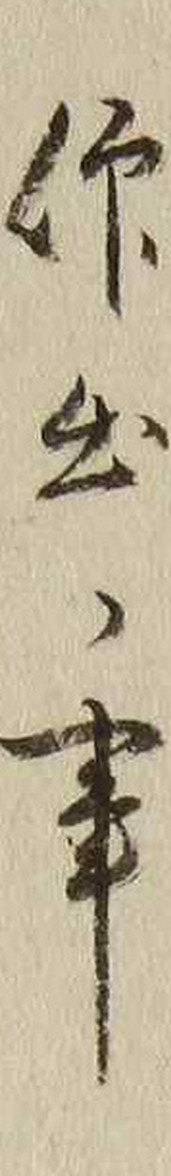仰出候事
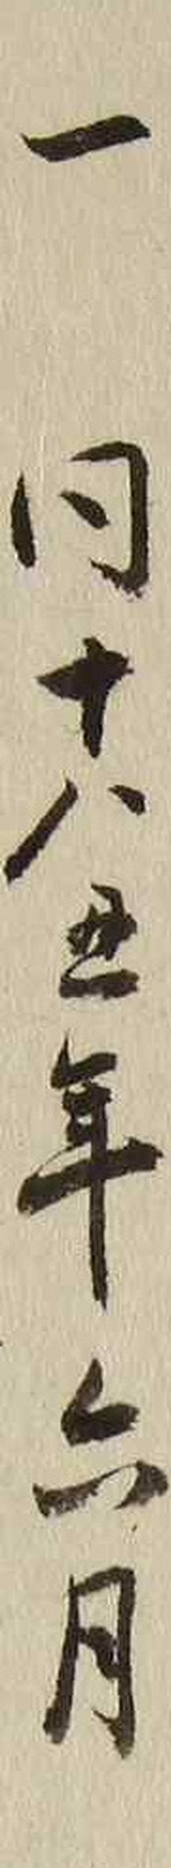一同十八丑年六月
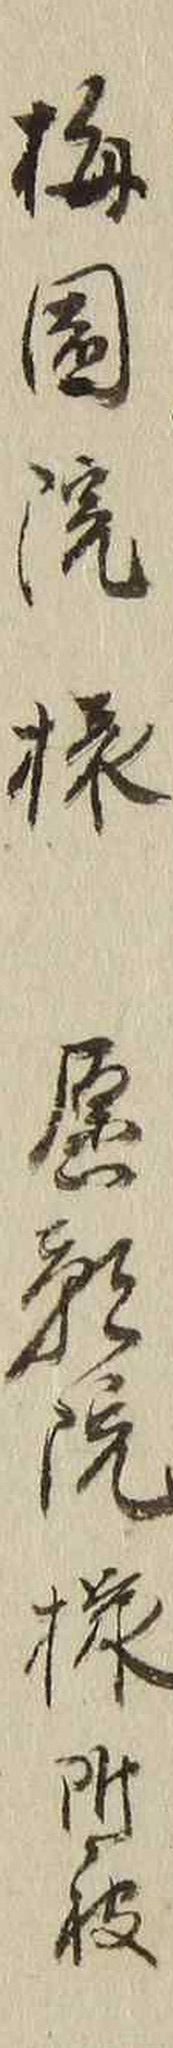梅園院様愿彰院様附候被
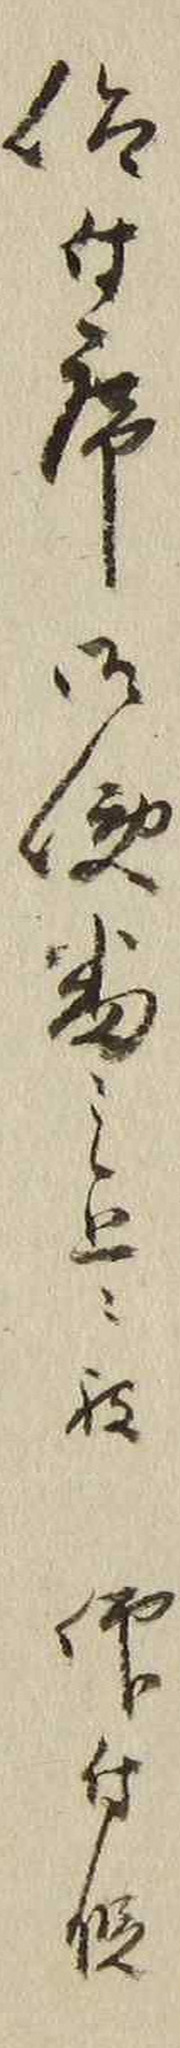仰付席御使番之上ニ被仰付候
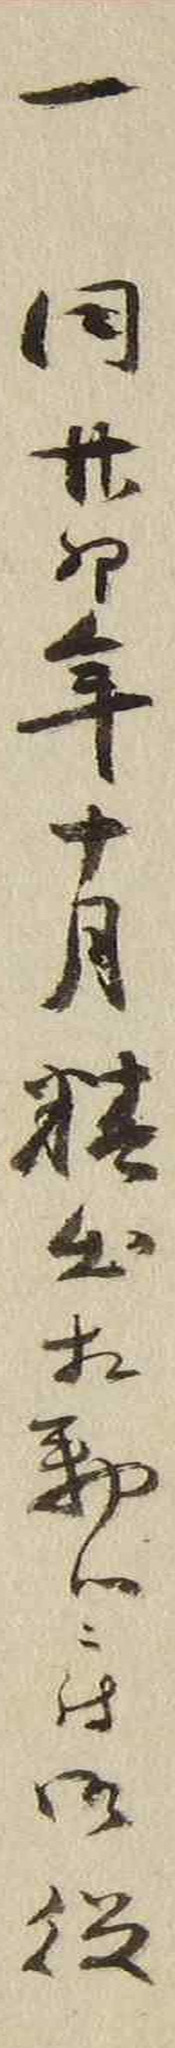一同廿卯年十月精出相勤候ニ付御役
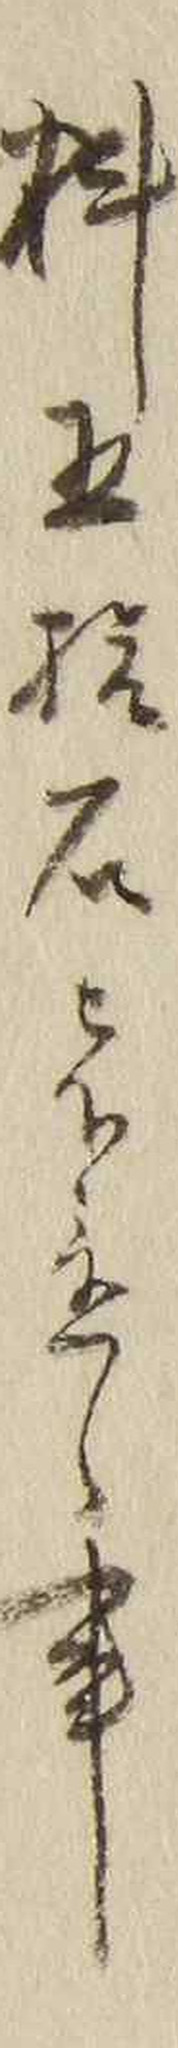料五拾石被下置候事

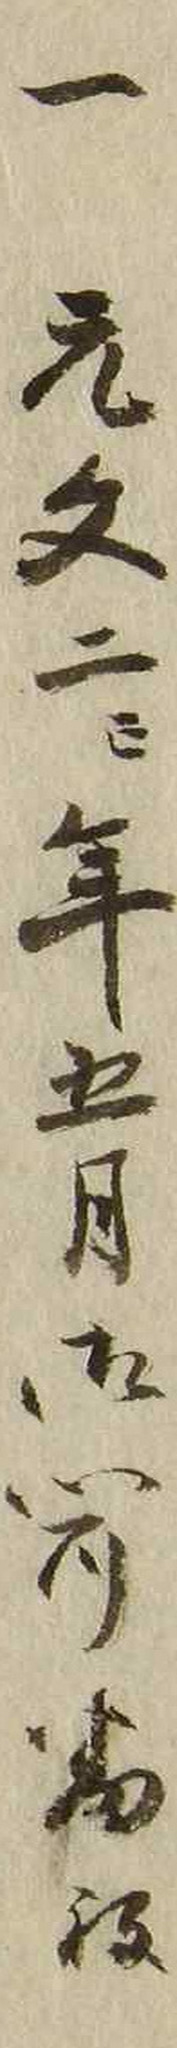一元文二巳年五月御聞番被
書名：諸士系譜　巻之225　ま之部6
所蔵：会津若松市立会津図書館
